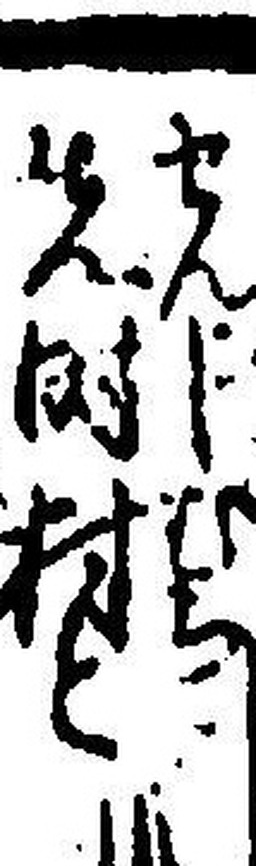先時村と
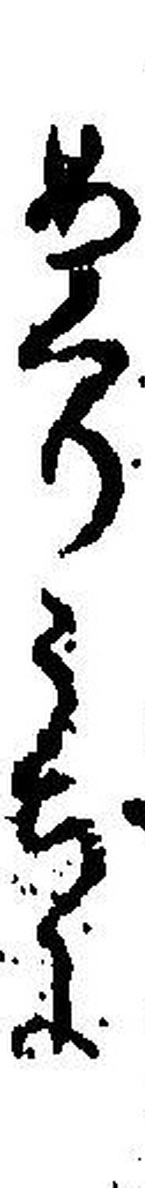めくりうちに
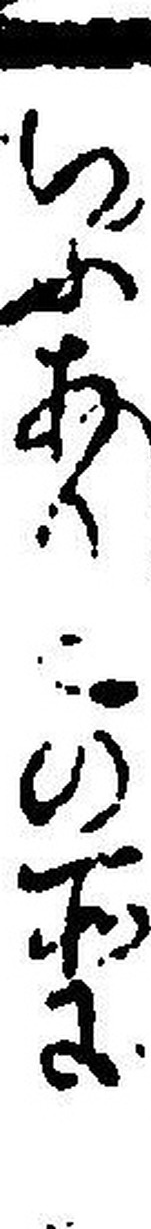いふありこの所に
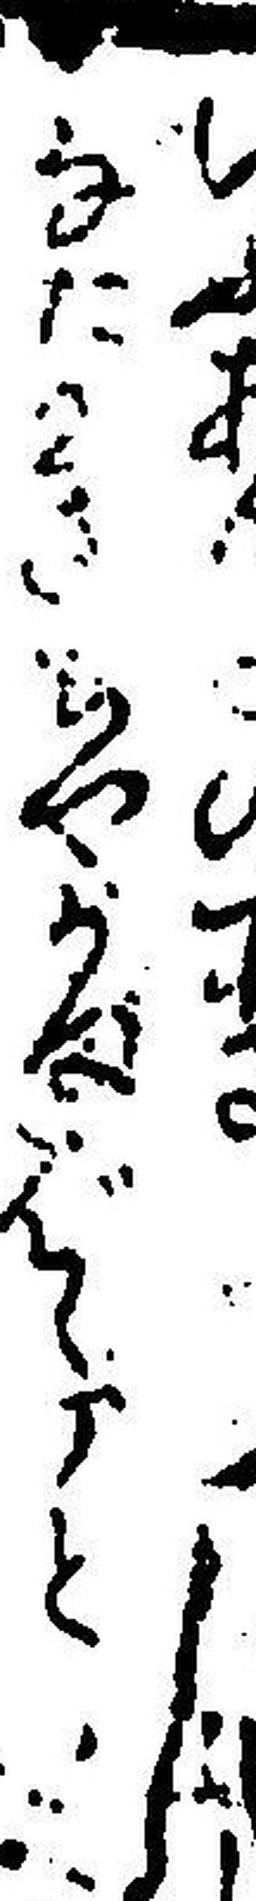なたかきちやかまばゞあアと
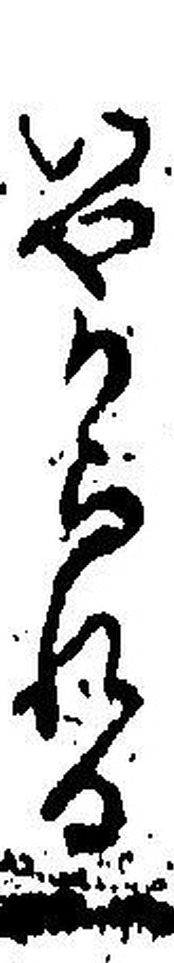いやかられる
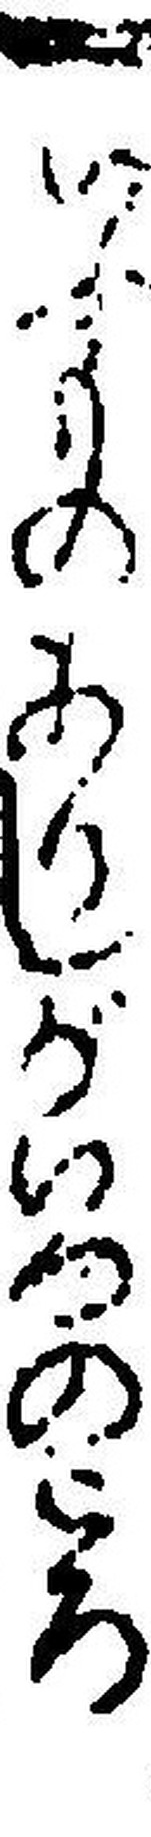いふものありしがいつのころ
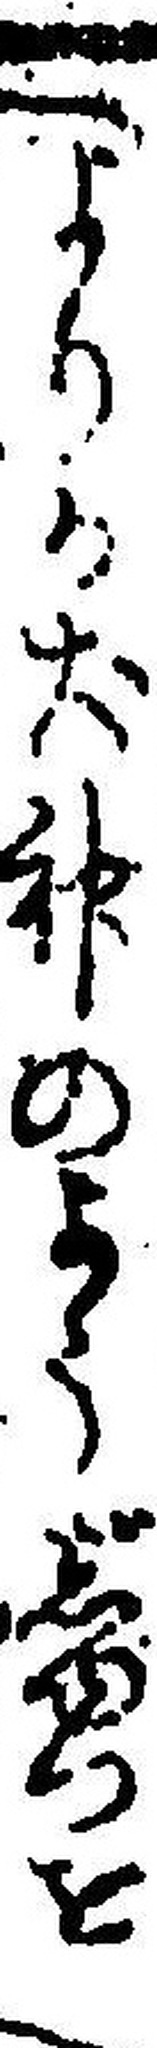より犬神のようじゆつを
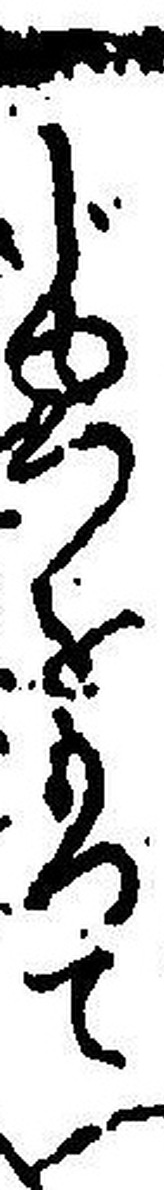じゆつをもつて
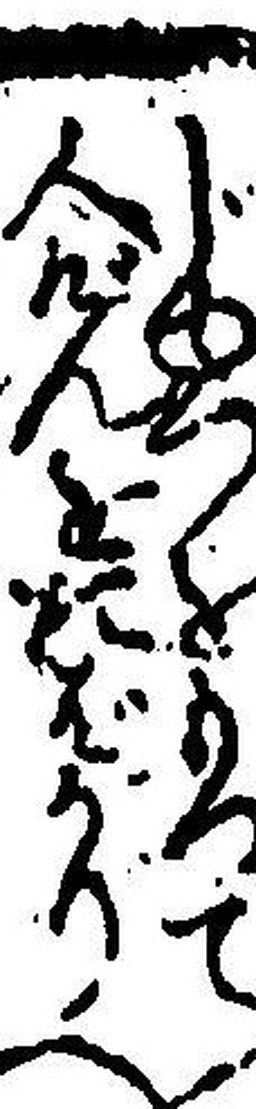人げんをたばかり
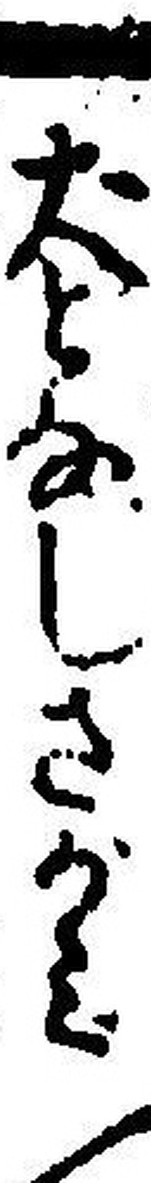犬となしさかみ
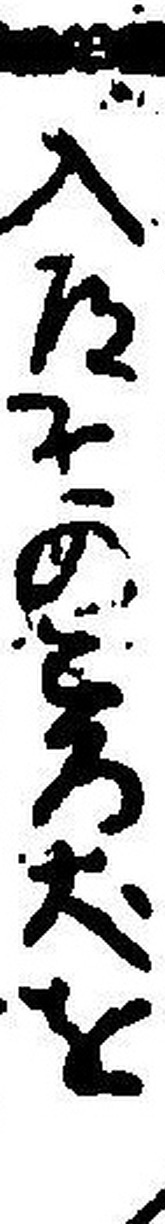入道そのころ犬を
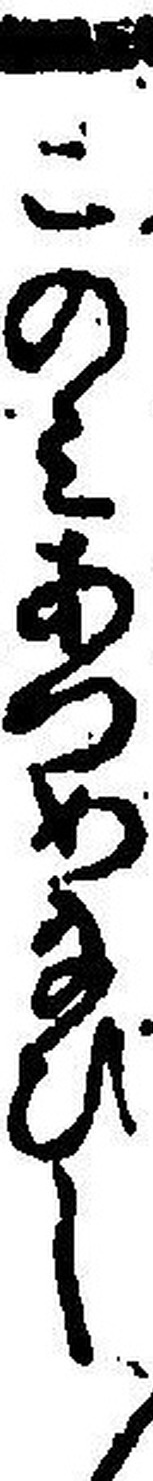このみあつめ給ひし
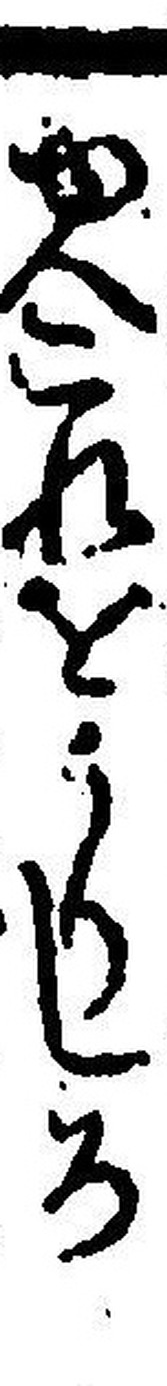ゆへこれをうりしろ
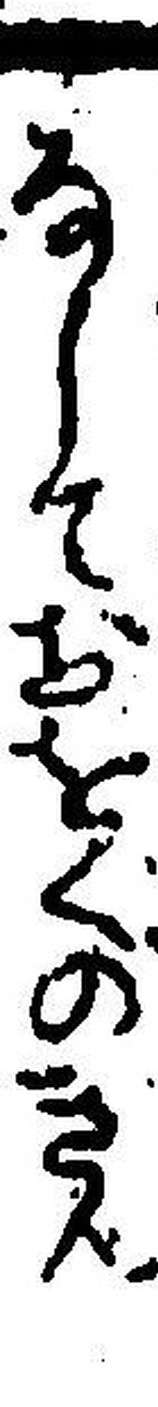なしておをくのきん
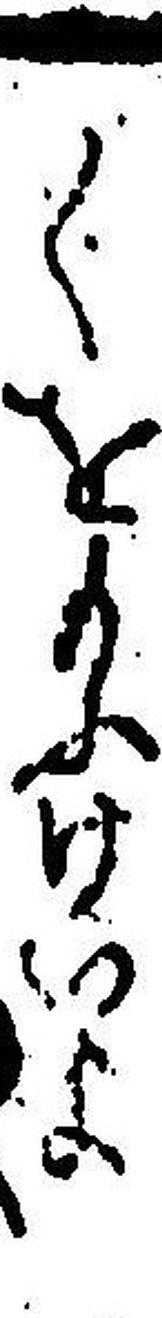〳〵をもふけいよ
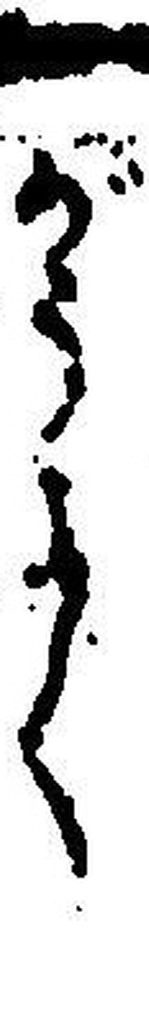がうよく
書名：花芳野犬斑 / 山東京伝作
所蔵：東京大学総合図書館 General Library in the University of Tokyo, JAPAN
